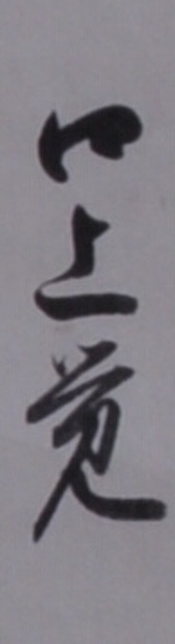口上覚
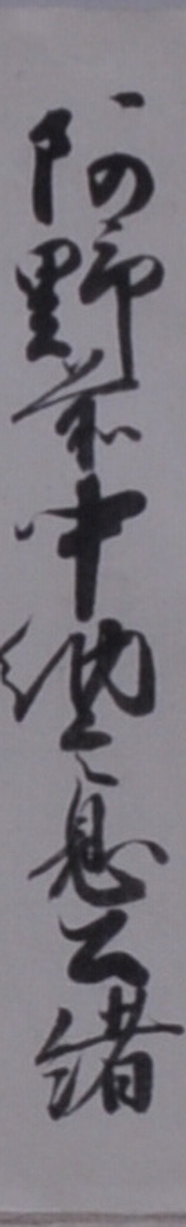阿野前中納言則公緒
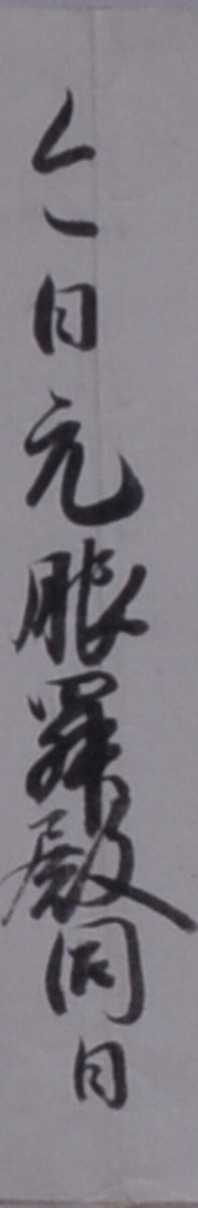今日元服昇殿同日
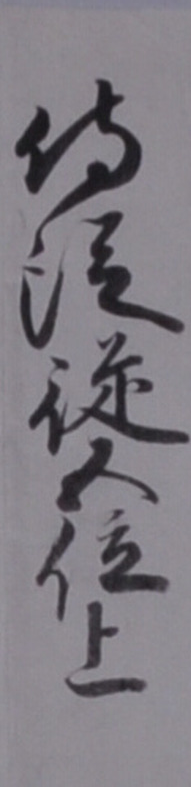侍従従五位上
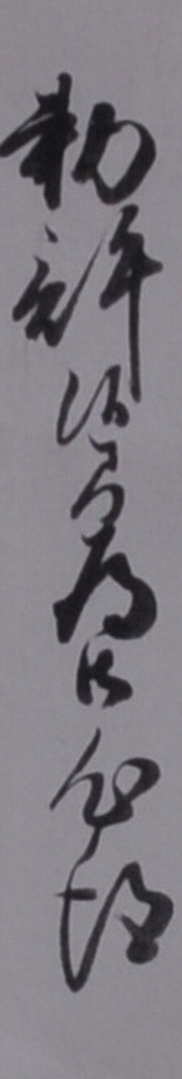勅許候間為御心得
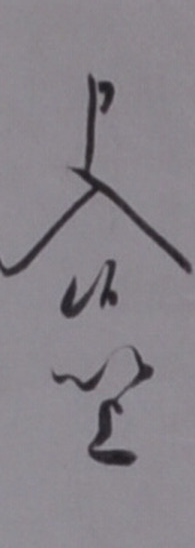申入候以上
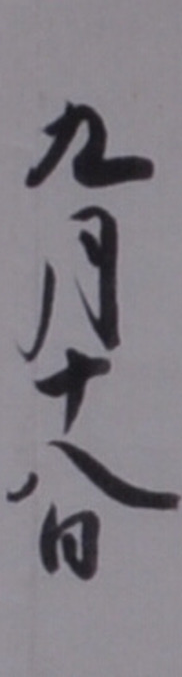九月十八日
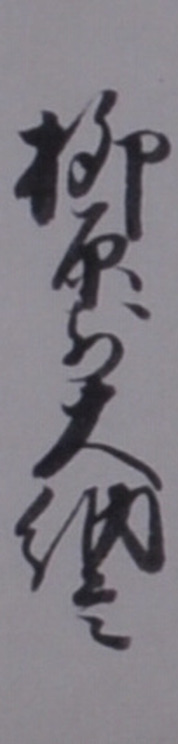柳原前大納言
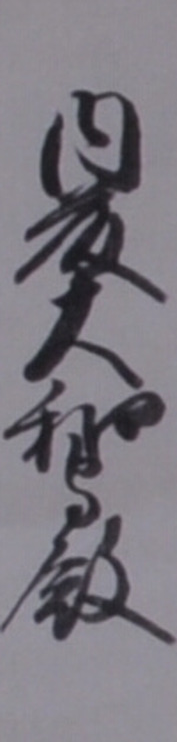内藤大和守殿
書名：口上覚
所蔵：伊那市立高遠町図書館・合同会社AMANE
